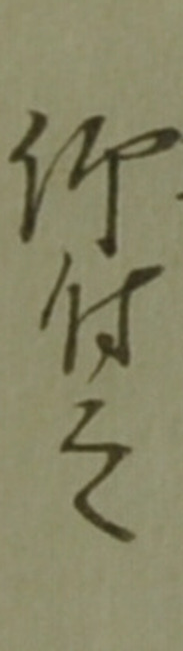仰付之
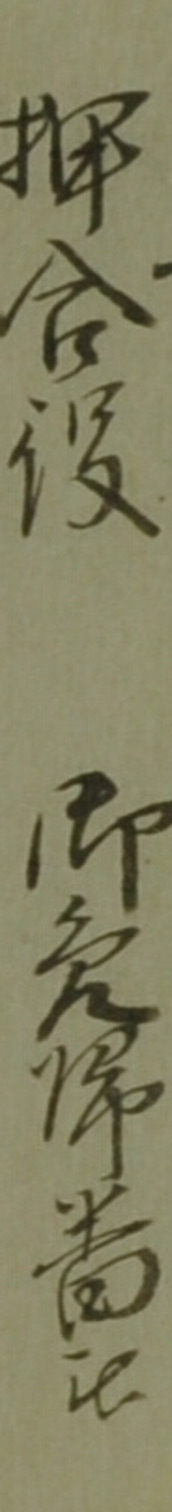押合役御免帰番被

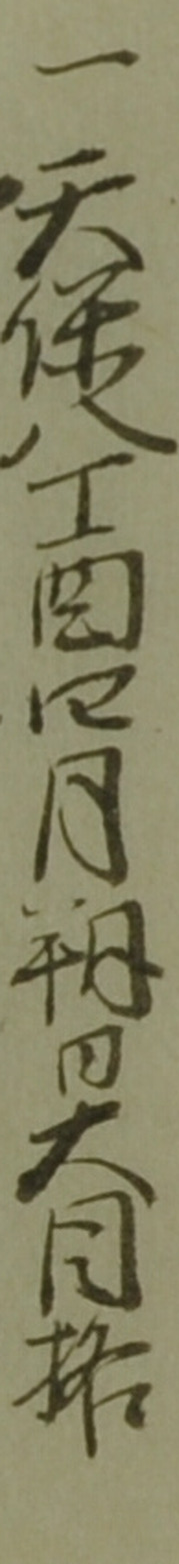一天保八丁酉四月朔日大目格
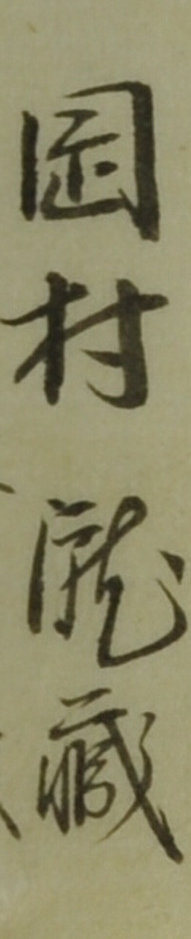岡村瀧蔵
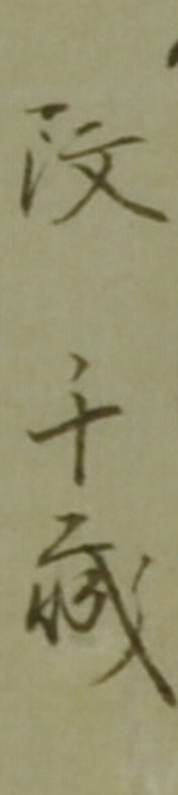改千蔵
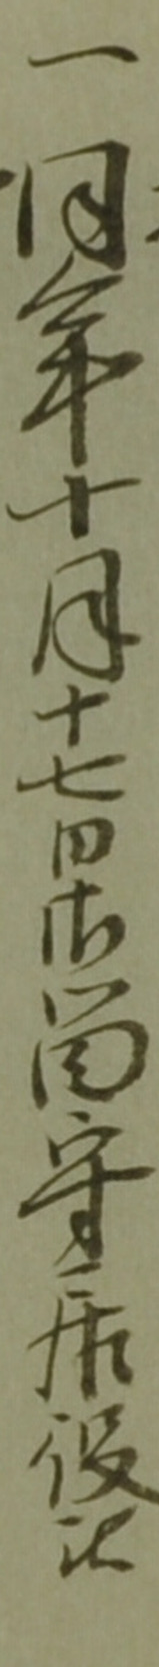一同年十月十七日御留守居役被
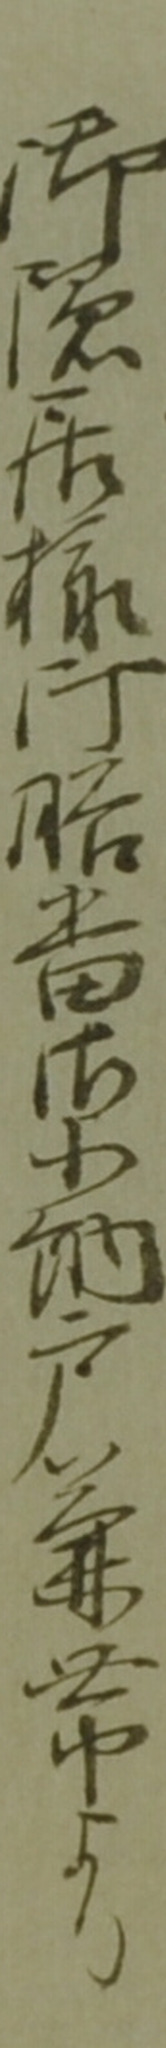御隠居様御膳番御小納戸兼帯より
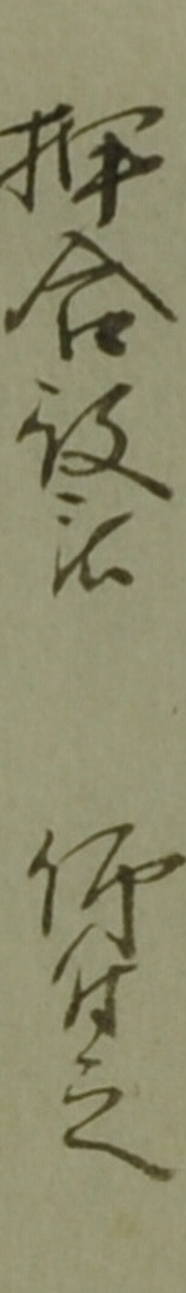押合役被仰付之
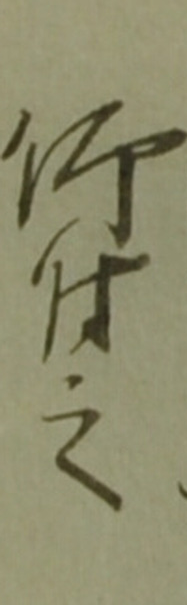仰付之
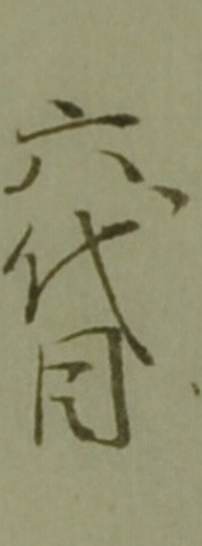六代目
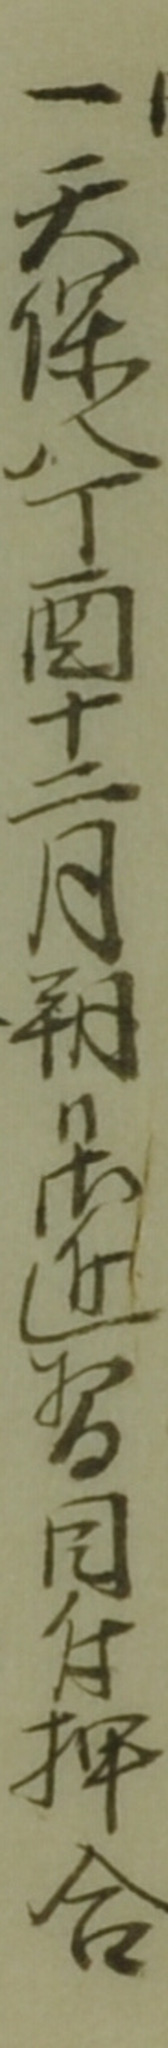一天保八丁酉十二月朔日御近習目付押合
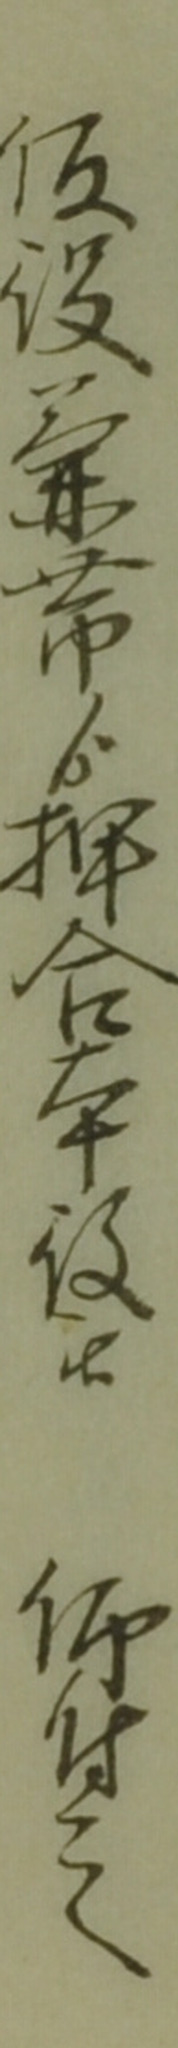仮役兼帯ゟ押合本役被仰付之
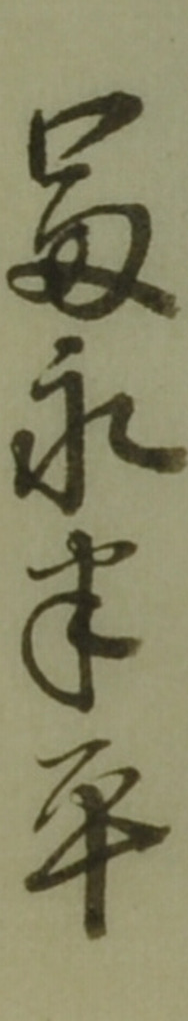冨永半平
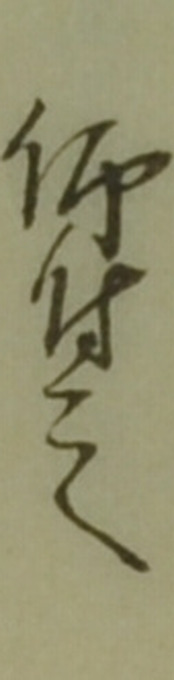仰付之
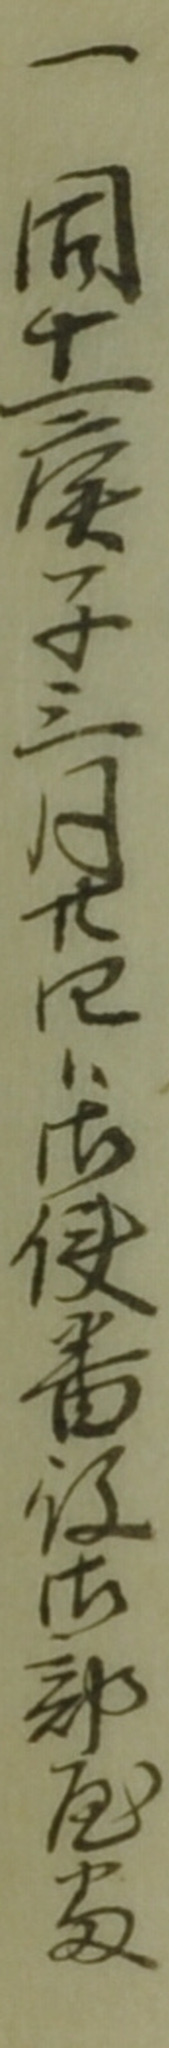一同十一庚子三月廿四日御使番役御部屋番
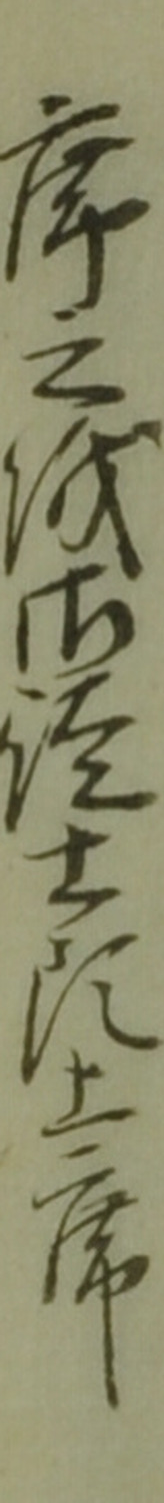席之儀御徒士頭上席
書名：諸御役代々録（七）
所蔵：伊那市立高遠町図書館・合同会社AMANE
